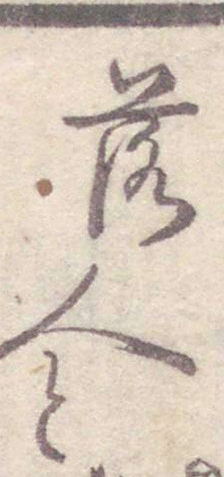落人と
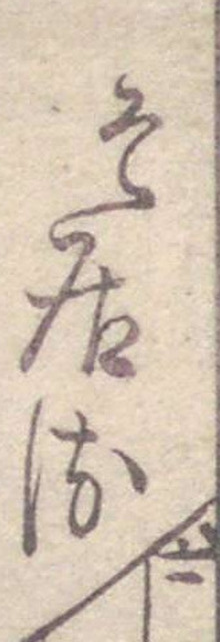そ居る
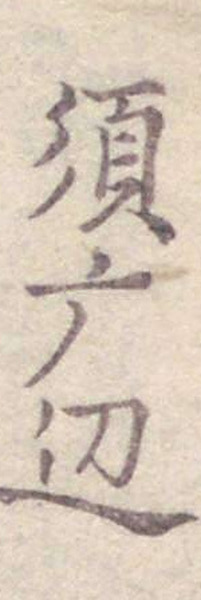須磨辺
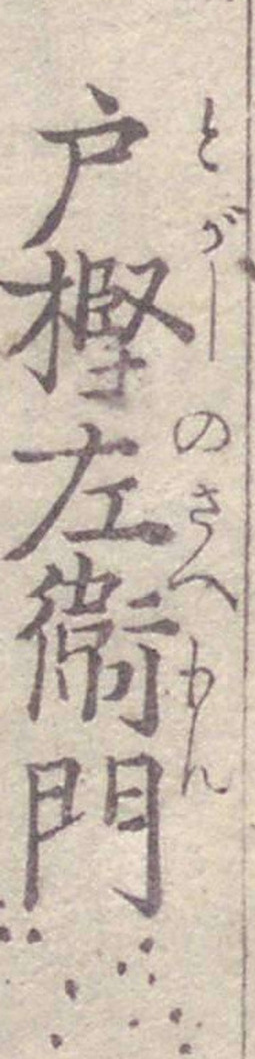戸樫左衛門
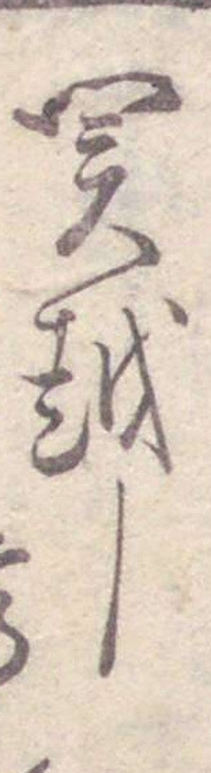関越し
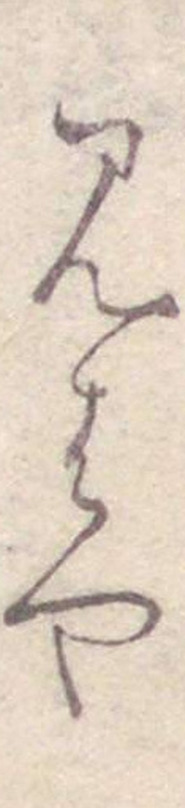見はや
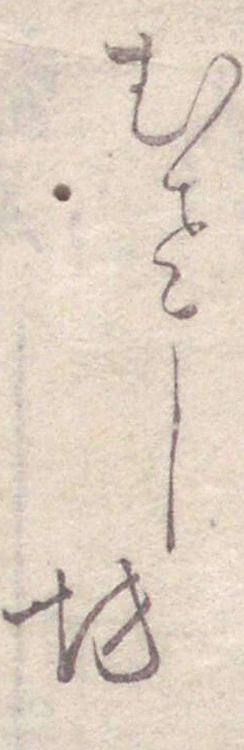むさし坊
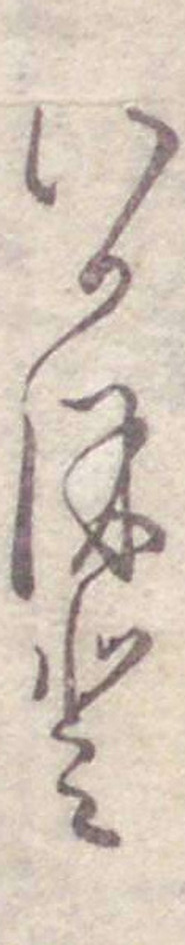いかほと
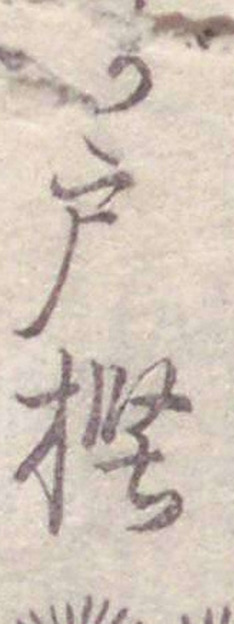と戸樫

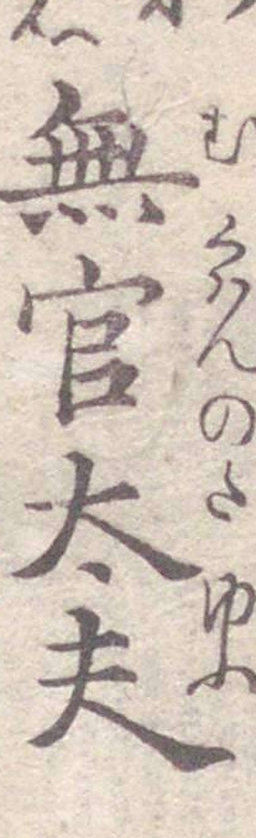無官太夫
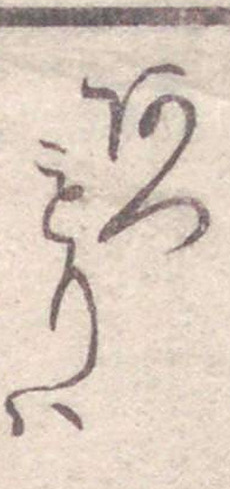もりは
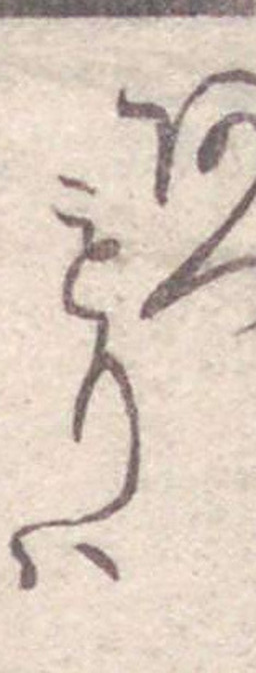もりは
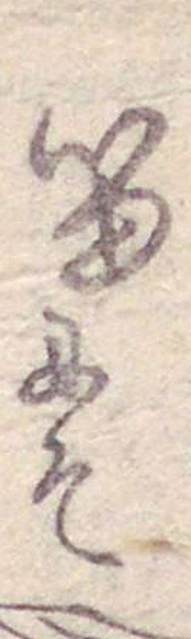笛にそ
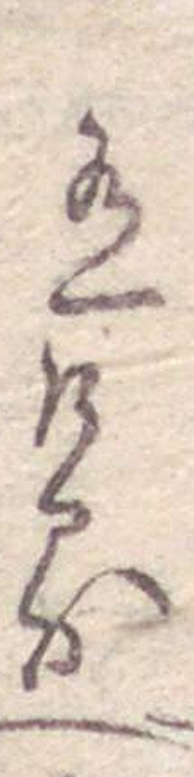有ける
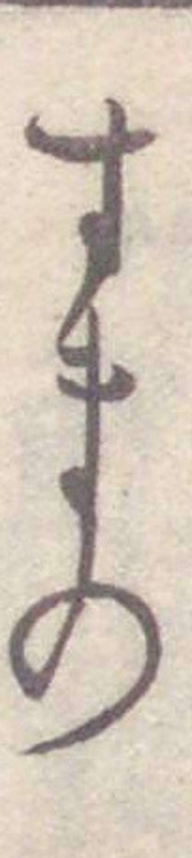すまの
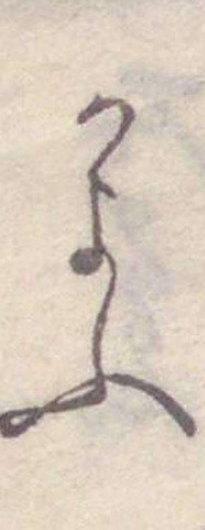かよふ
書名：繪本八十宇治川
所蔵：九州大学中央図書館 国文学研究資料館
